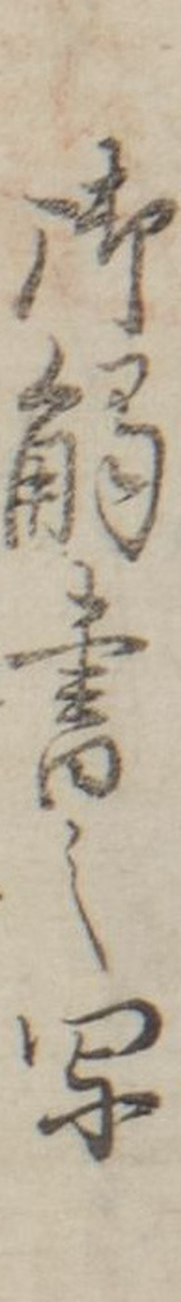御触書之写
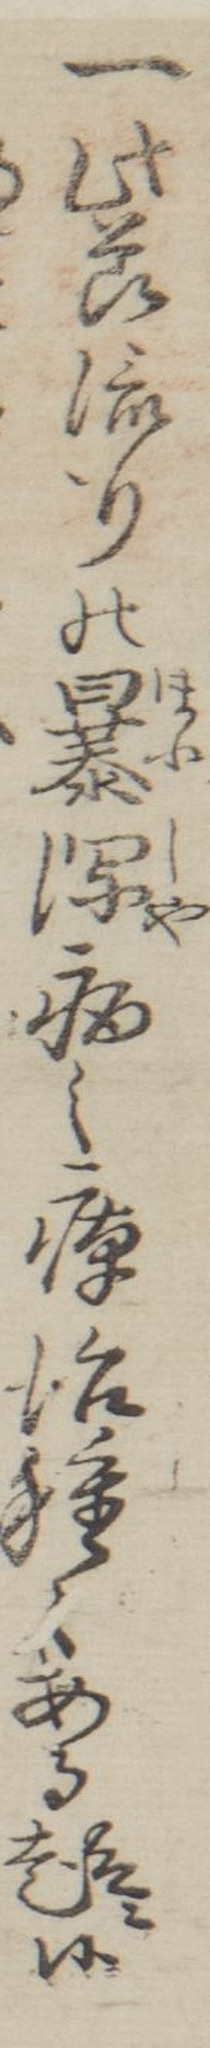一此節流行の暴瀉病之療治種々ある趣に候
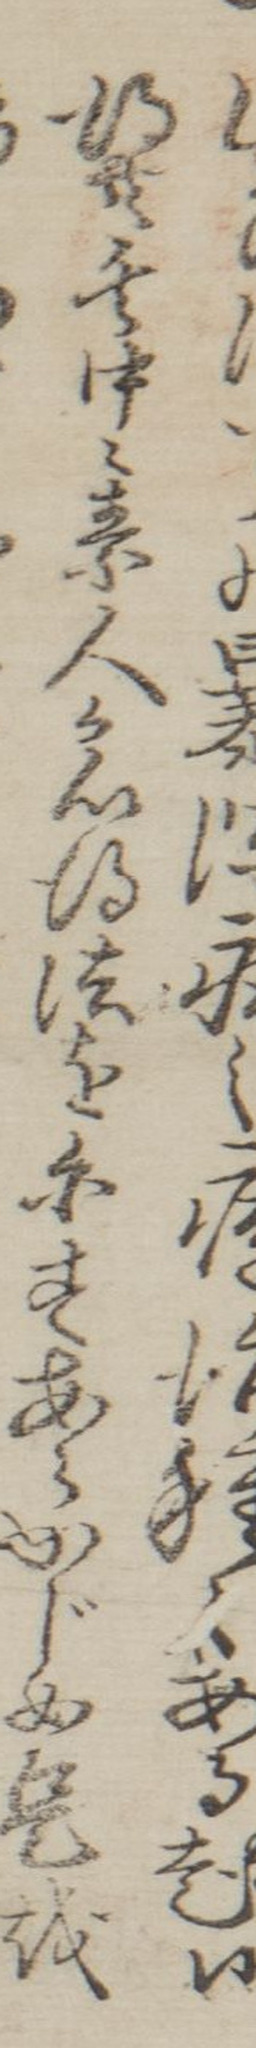得共其中に素人か心得法を示すあらかじめ是を
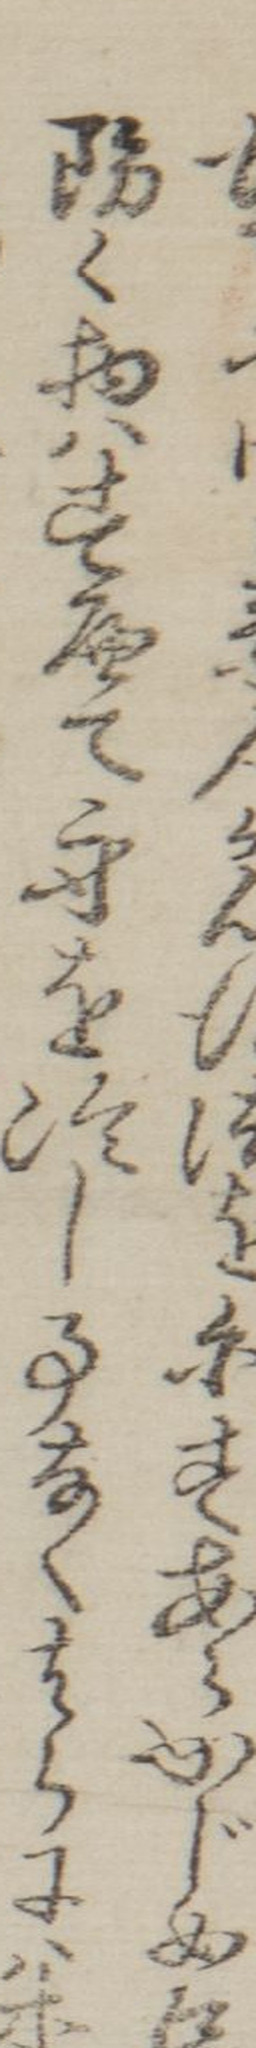防く物はすへて身を冷し事なくはらには木綿巻
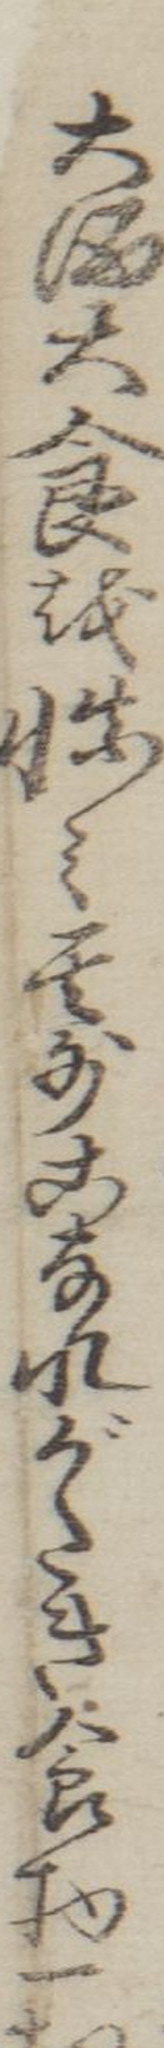大酒大食を慎み其外こなれがたき食物一切慎み
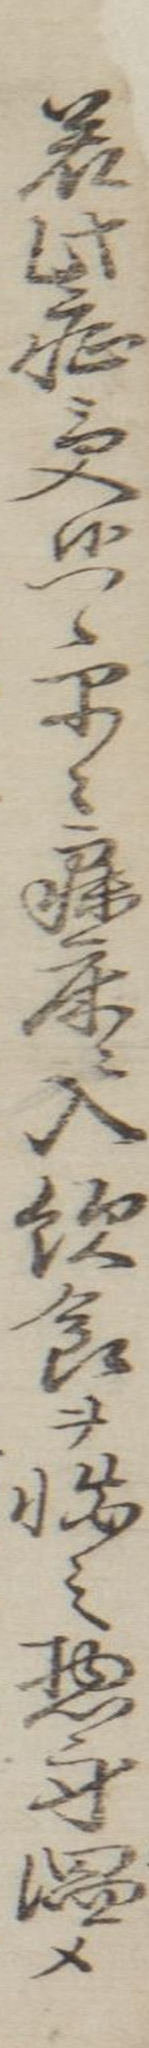若此病受候はゝ早々寝床に入飲食を慎み惣身温め
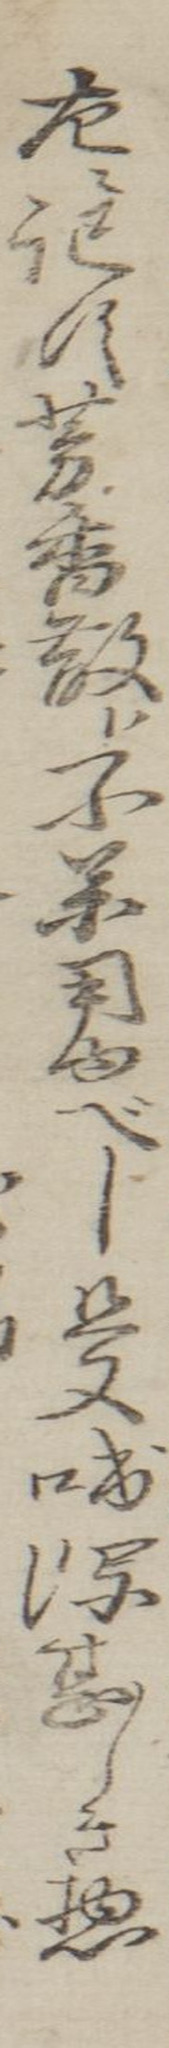左に記す芳香散といふ薬用ゆべし且又吐瀉甚しき惣
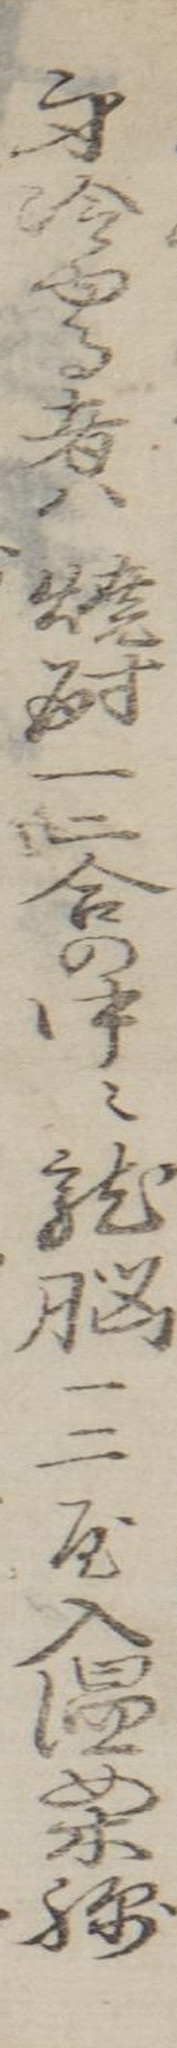身冷ゆる者は焼酎一二合の中に龍脳一二包入温め木綿
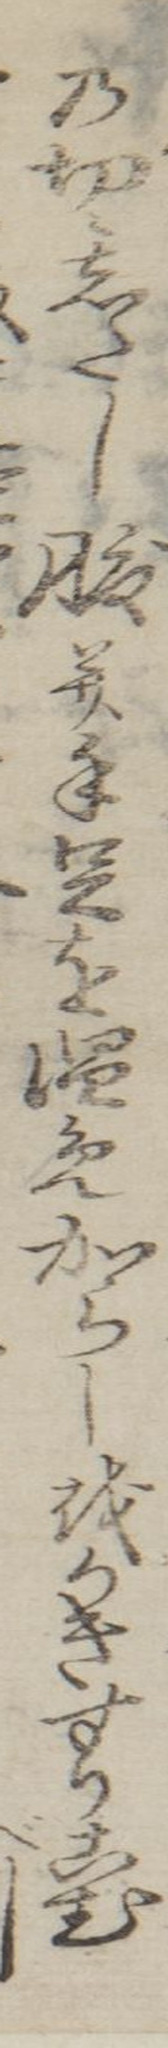の切にしたし腹并手足温めからしをかきすりこむべし
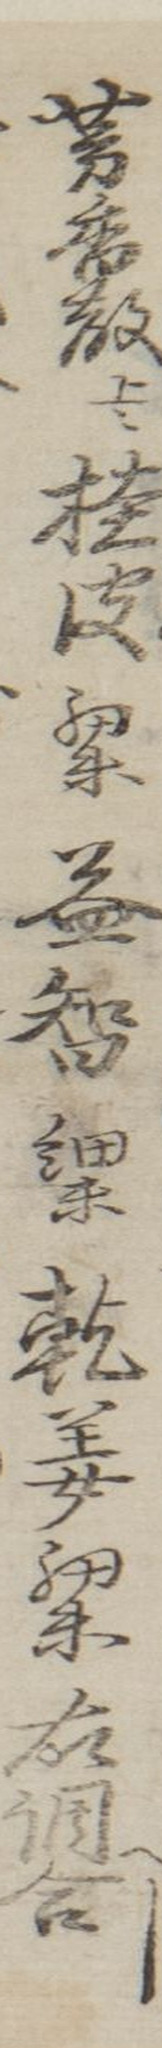芳香散上に桂皮細末益智細末乾姜細末故調合
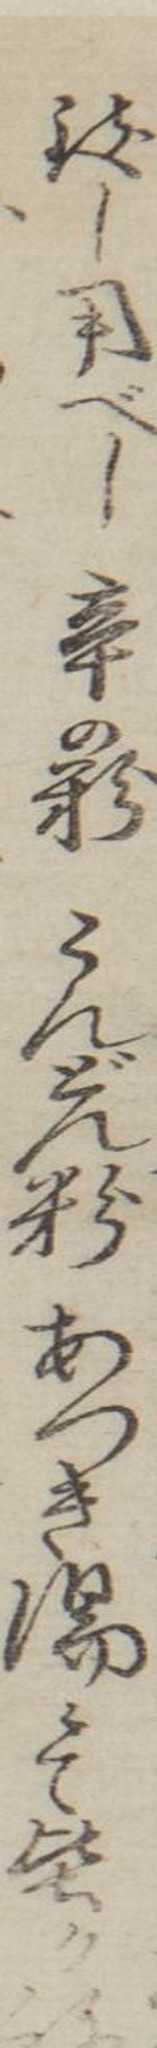致し用べし辛の粉うんどん粉あつき湯にて堅くねり
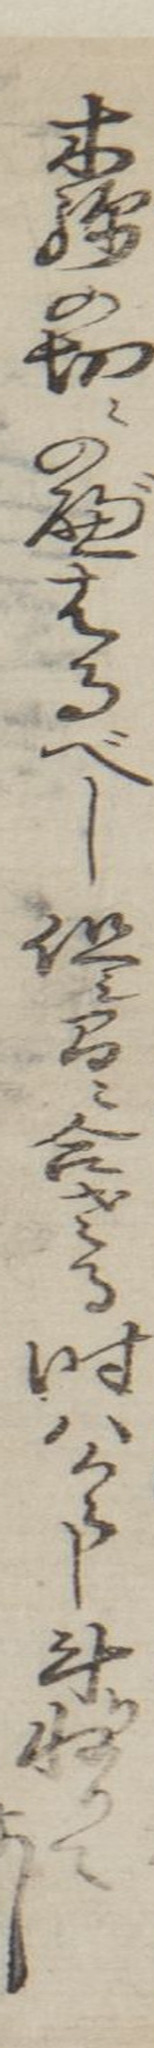木綿の切にのべはるべし但し間に合さる時はからし斗りねりてよし
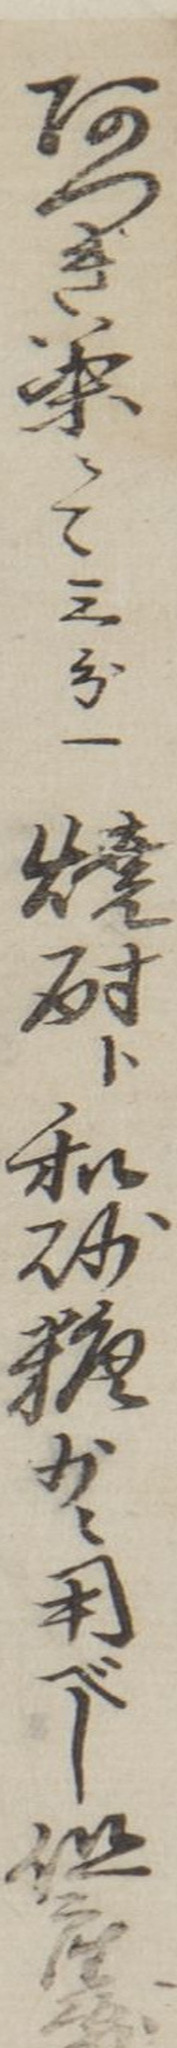あつき茶にて三分一焼酎と和砂糖少々用べし但座敷
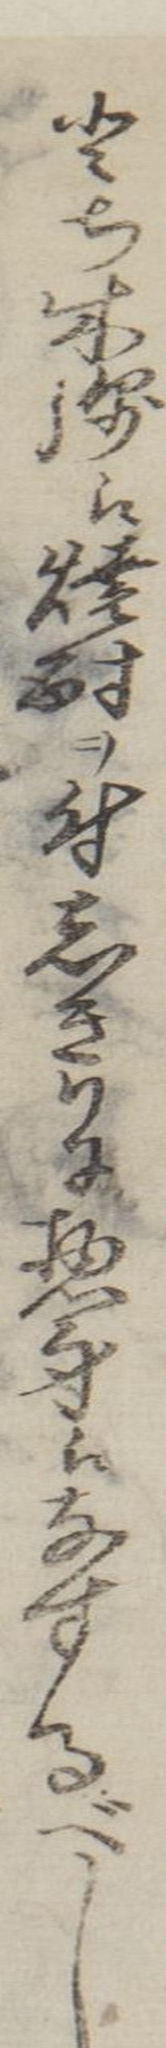とち木綿え焼酎を付しきりに惣身えなするべし
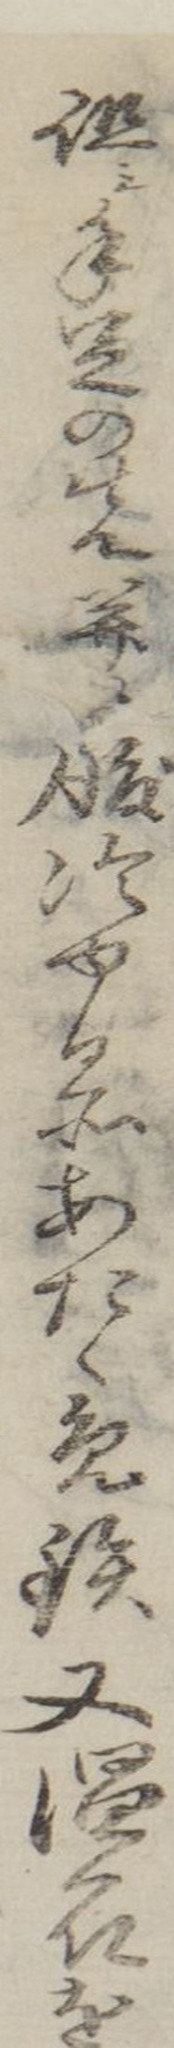但し手足の先并に腹冷ゆる所あたゝめ鉄又は温石を
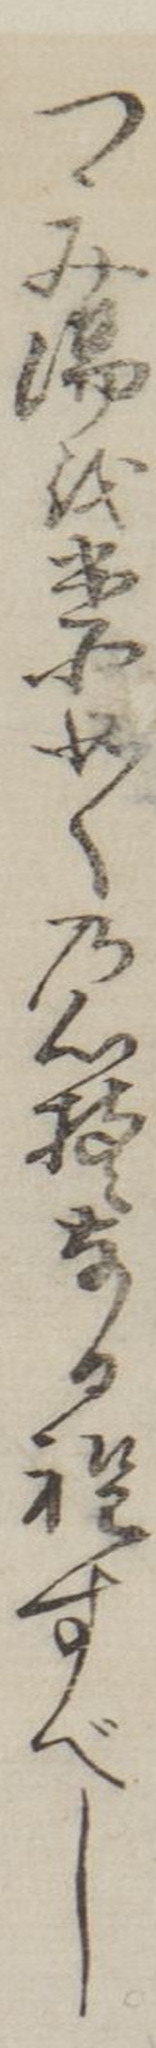つゝみ湯を遣ふ如くの心持になる程すべし
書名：流行暴瀉病療治の御觸書の写
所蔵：あいおいニッセイ同和損保株式会社
